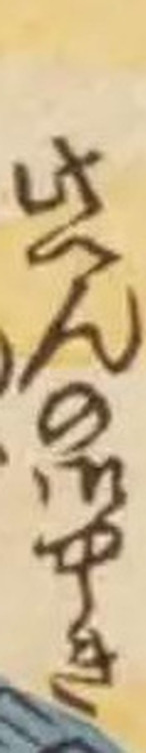此へんの御やしき
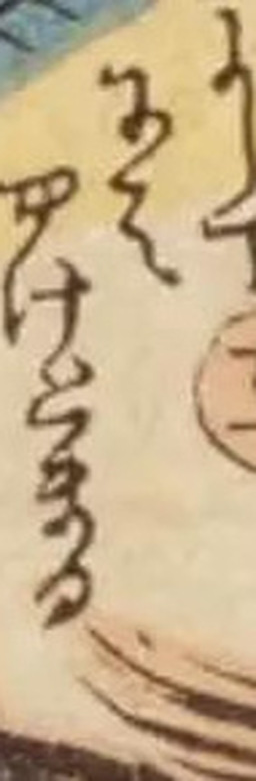やけとまる
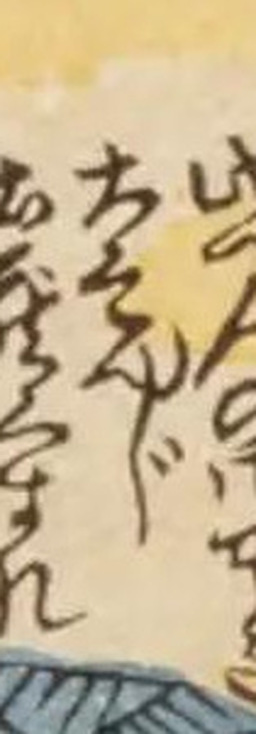土藏くすれ
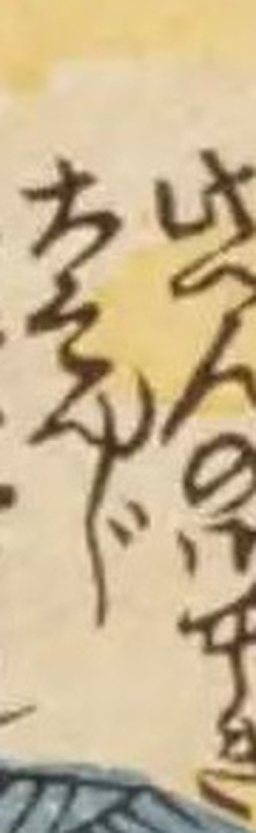大そんじ
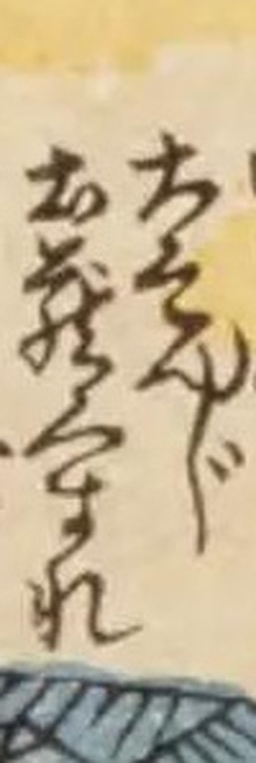土藏くすれ
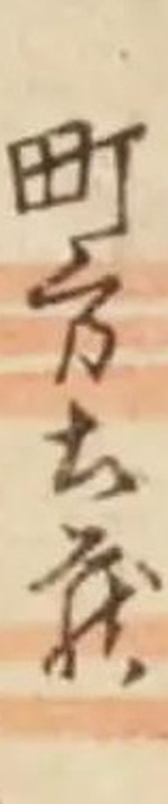町方土蔵
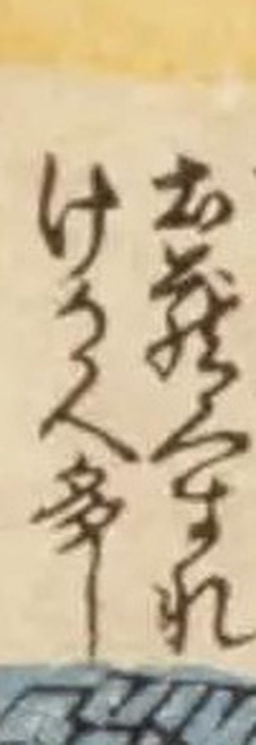けか人多し
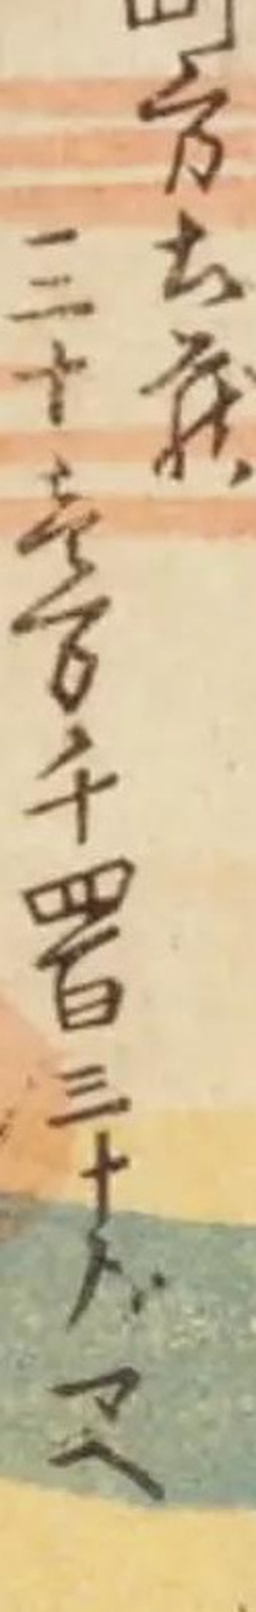三十壱万千四百三十戸まへ
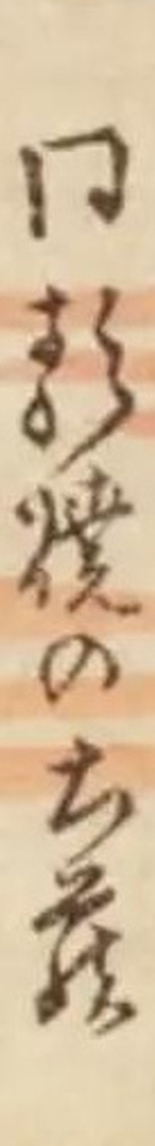同類焼の土蔵
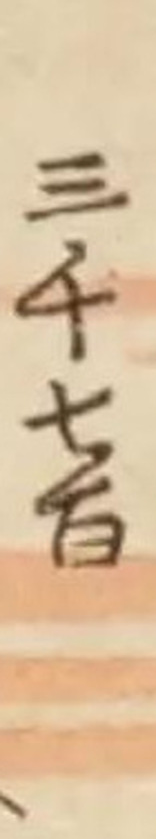三千七百
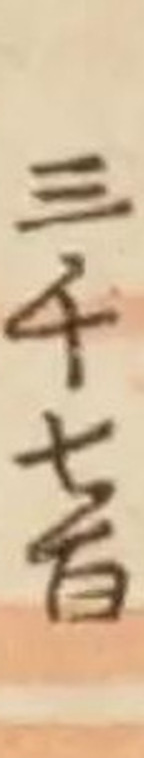三千七百
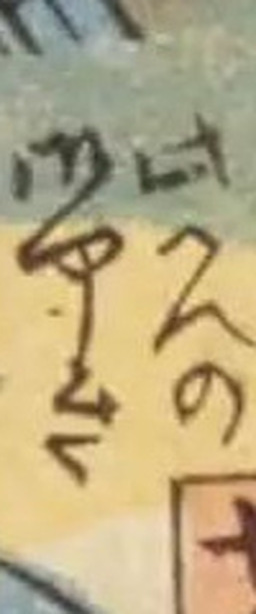御やしき
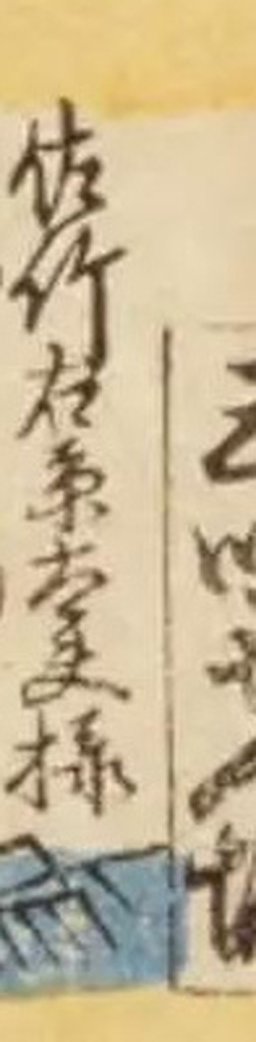佐竹右京太夫様
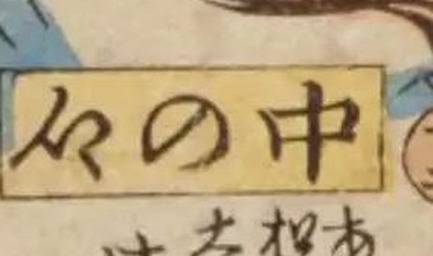中の郷
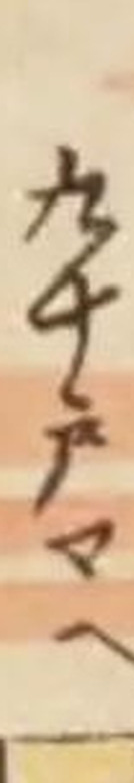九十戸まへ
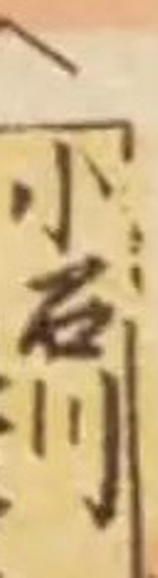小石川
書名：銘細改板江戸大地震出火場所附
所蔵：国立国会図書館 National Diet Library, JAPAN
